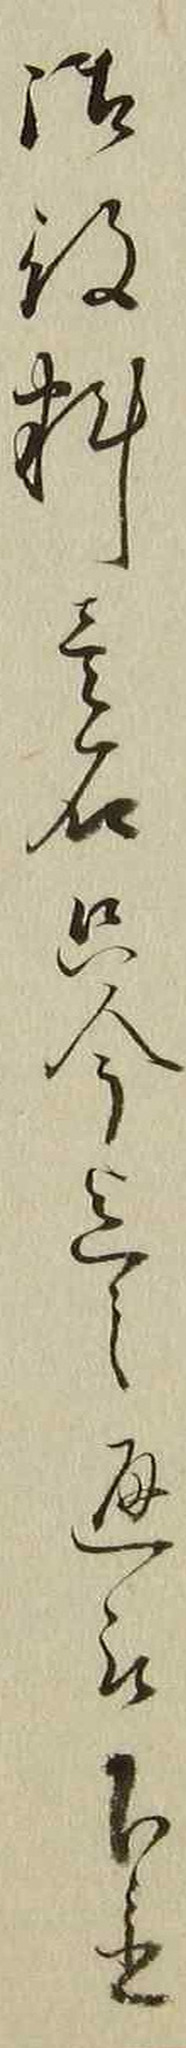御役料壱石只今迄之通被下置
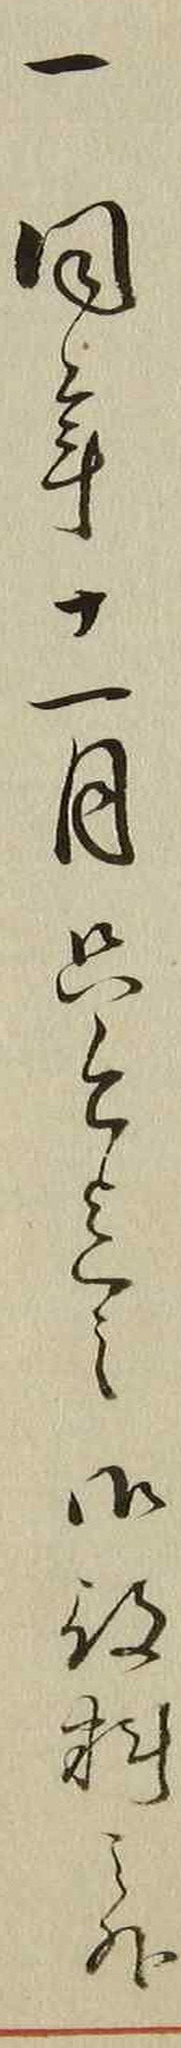一同年十一月只今迄之御役料之外
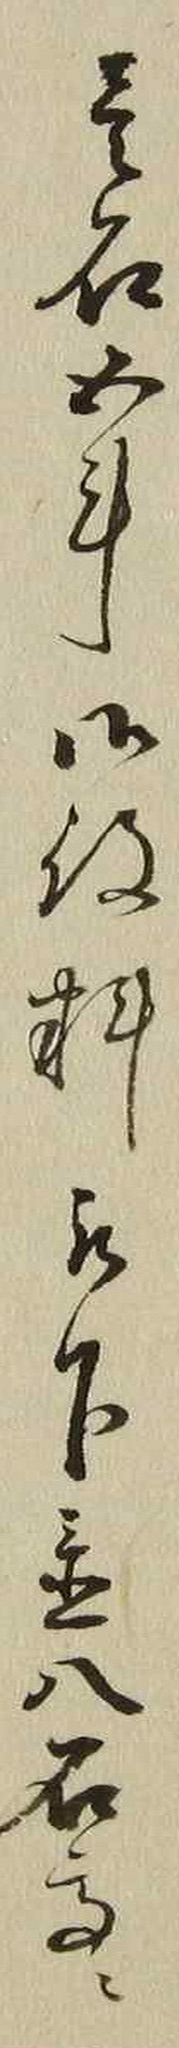壱石五斗御役料被下置八石高ニ
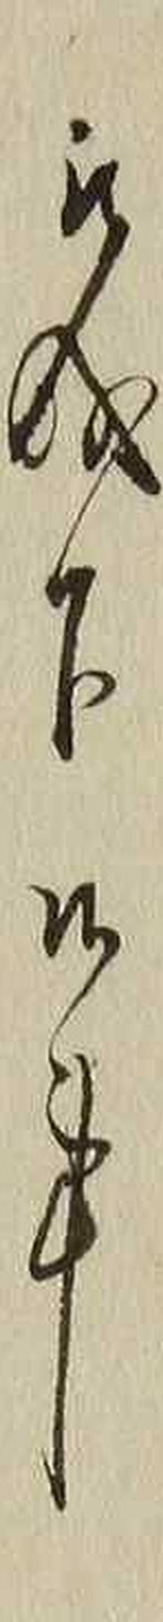被成下候事
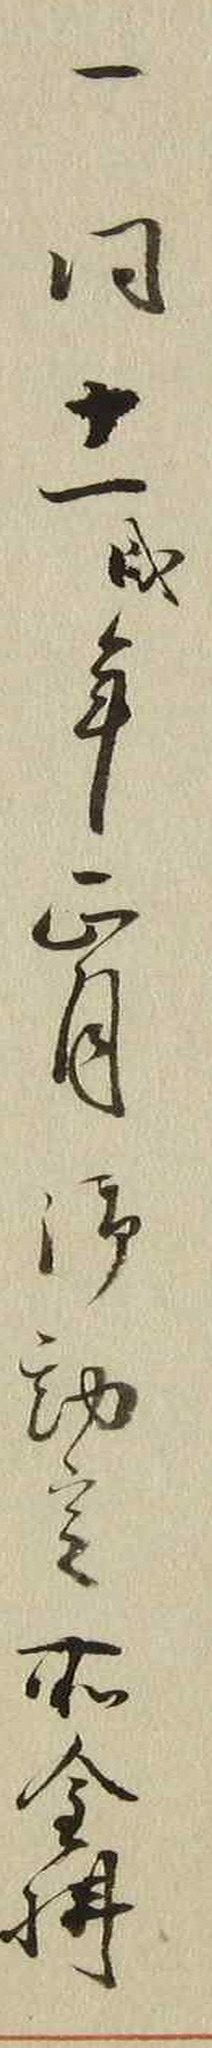一同十一戌年正月御勘定所金払
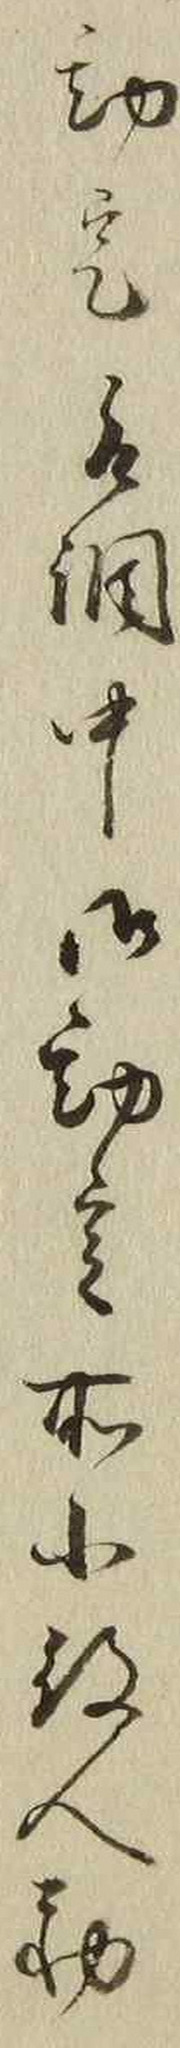勘定取調中御勘定所小役人勤
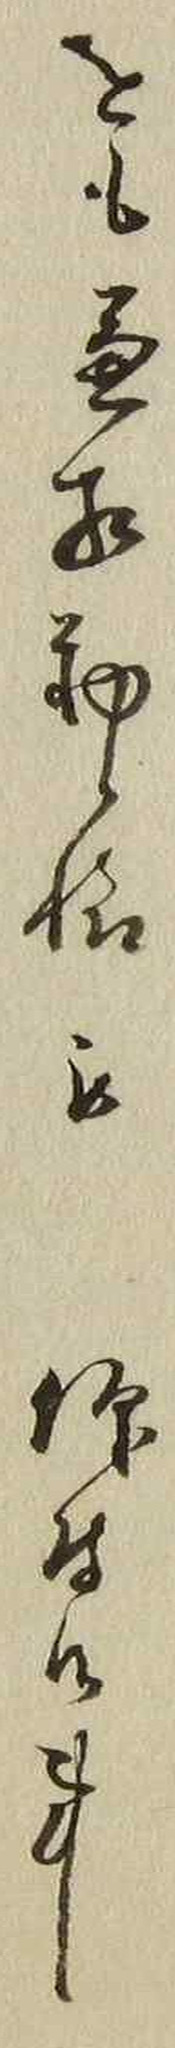をも兼相勤候様被仰付候事
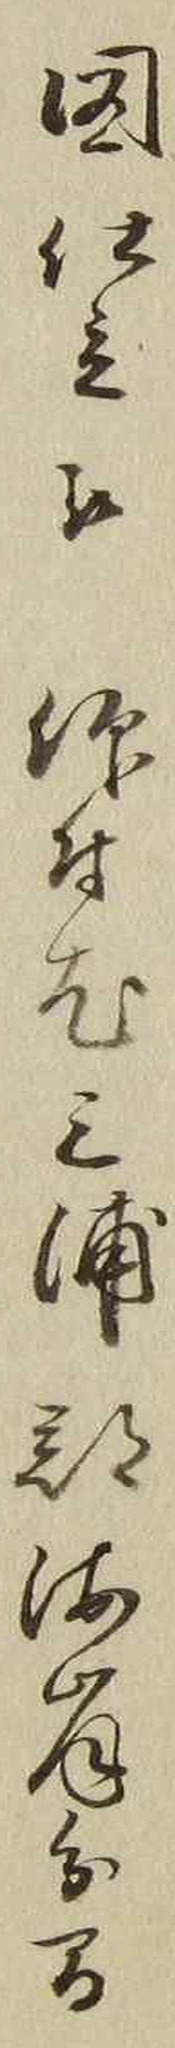図仕立被仰付尤三浦郡海岸分間
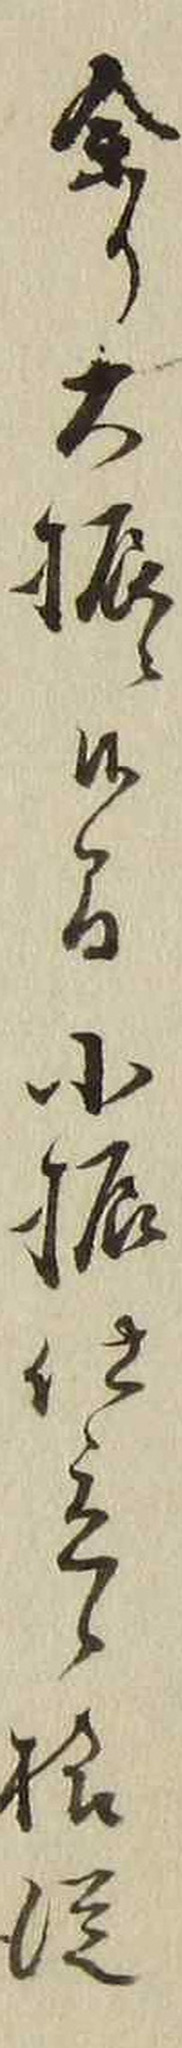余り大振ニ候間小振仕立候様従
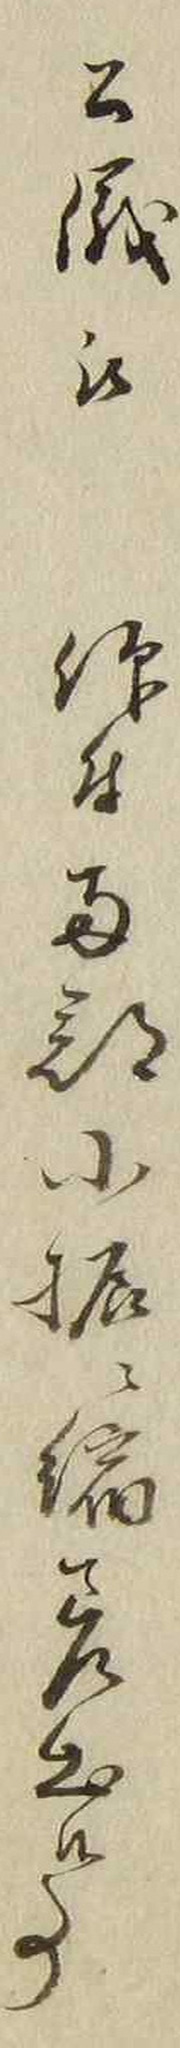公儀被仰付両郡小振ニ縮差出候事
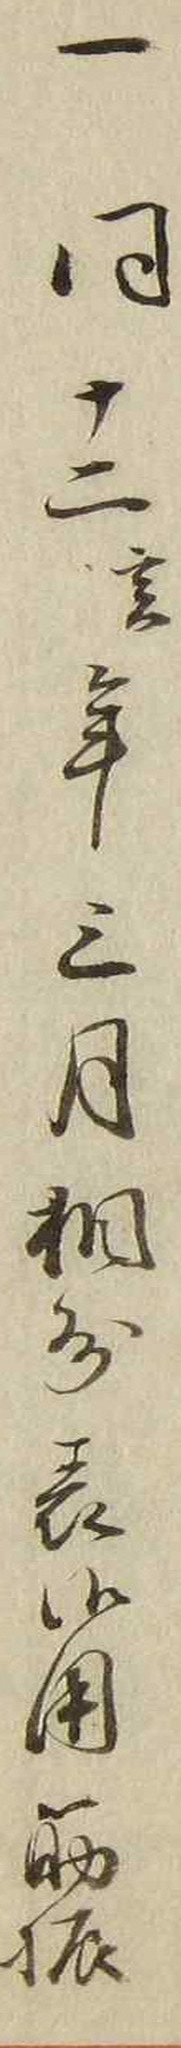一同十二亥年三月相州表御用筋振

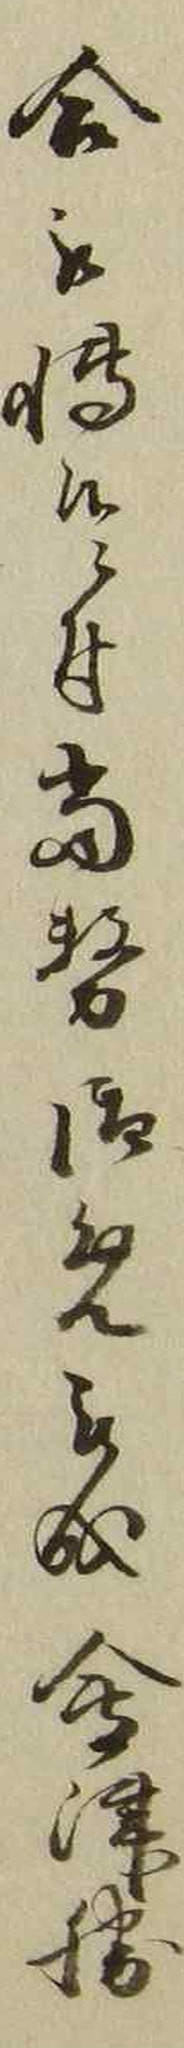合被転候ニ付当務御免被成会津勝
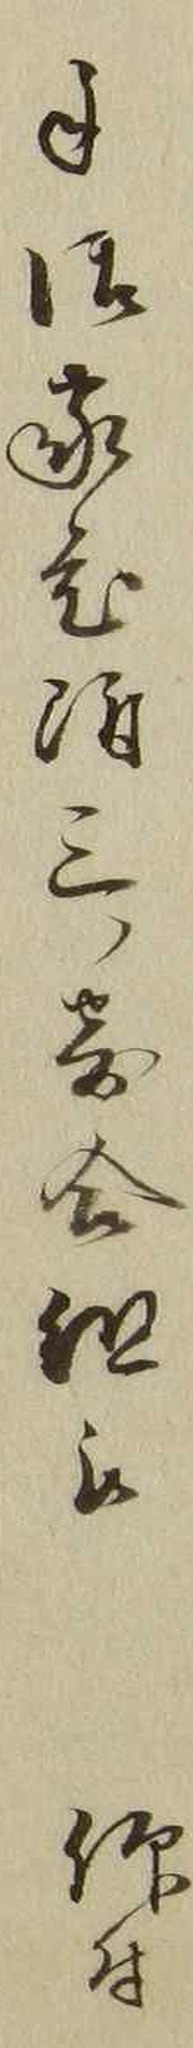手御家老附三ノ寄合組被仰付
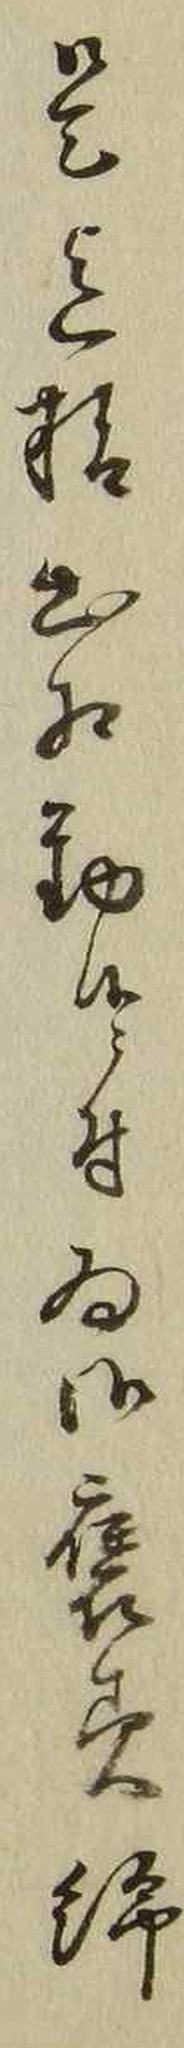是迄精出相勤候ニ付為御褒美綿
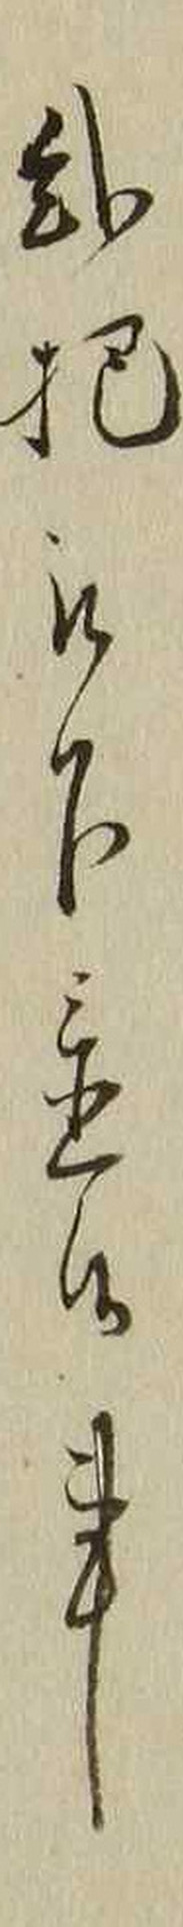弐把被下置候事
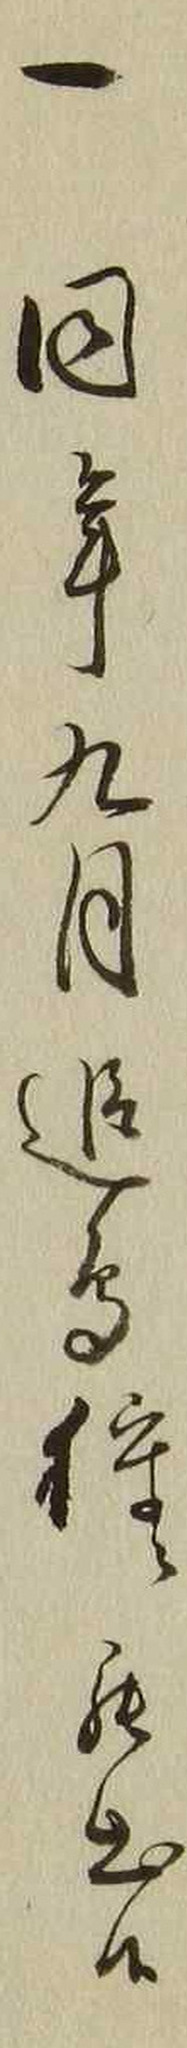一同年九月追鳥狩ニ罷出候
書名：諸士系譜　巻之32　い之部32
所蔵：会津若松市立会津図書館
